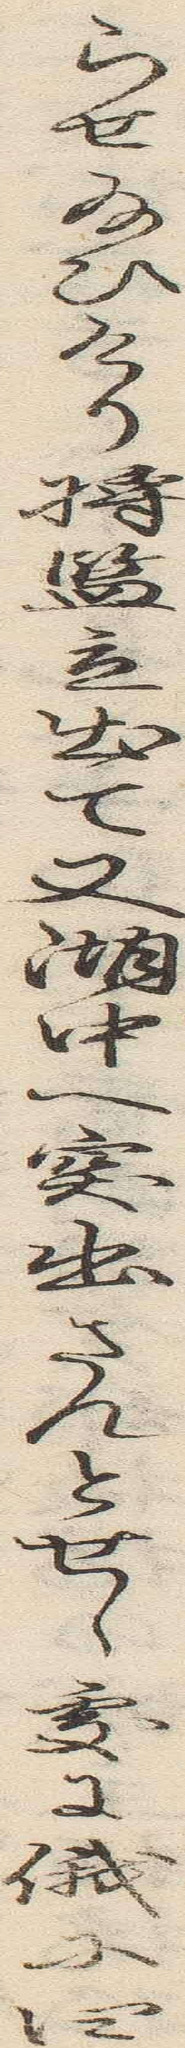らせ給ひけり将監立出て又湖中へ突出さんとせし處に俄に四
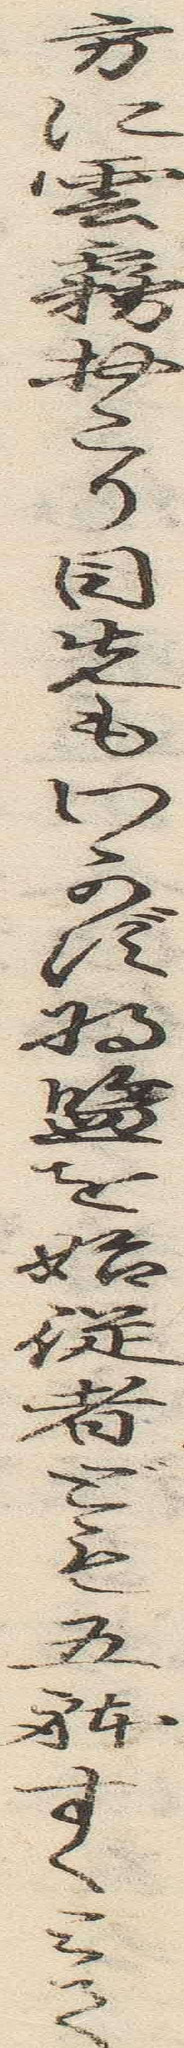方に雲霧おこり目先もわかず将監を始従者とも五躰すくみて
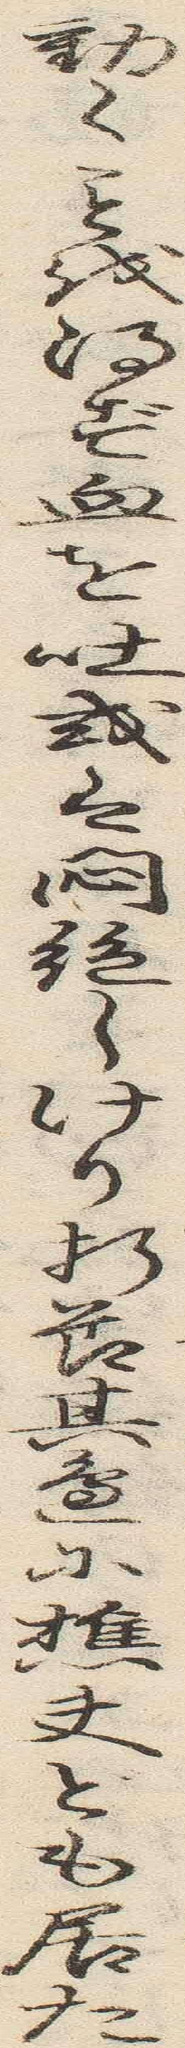動くことを得ず血を吐或は悶絶しけり折節其邊に樵夫ども居た
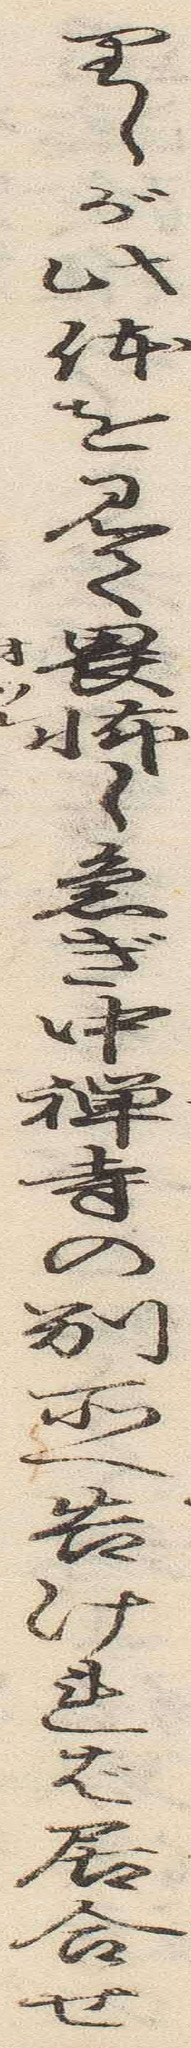りしが此体を見て畏怖し急ぎ中禅寺の別所へ告ければ居合せ
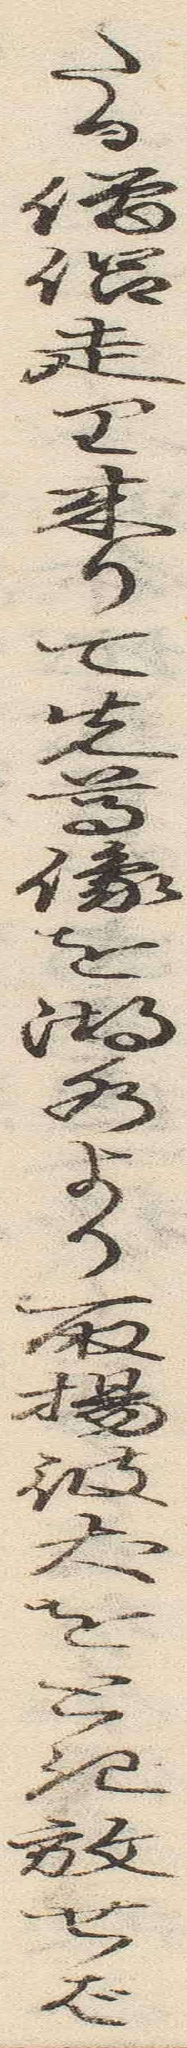たる僧侶走り來りて先尊像を湖水より取揚彼犬をとき放せば
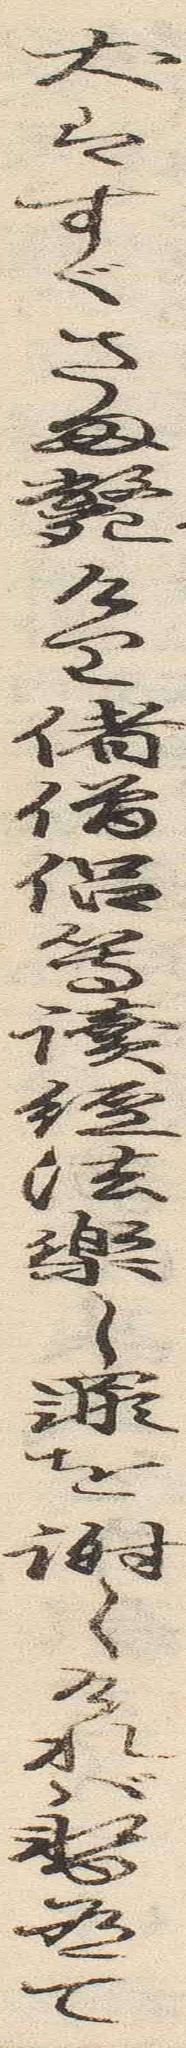犬はすぐさま斃けり偖僧侶等讀經法楽し罪を謝しければ暫有て
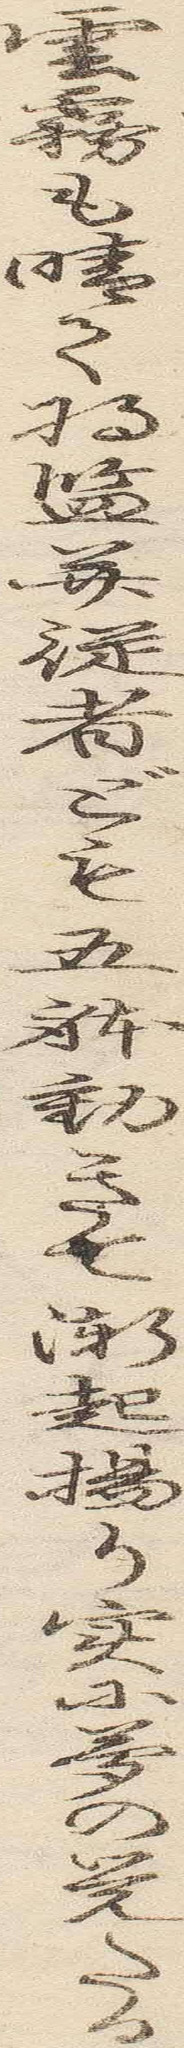雲霧も晴て将監并従者ども五躰動きて漸起揚り実に夢の覚たる
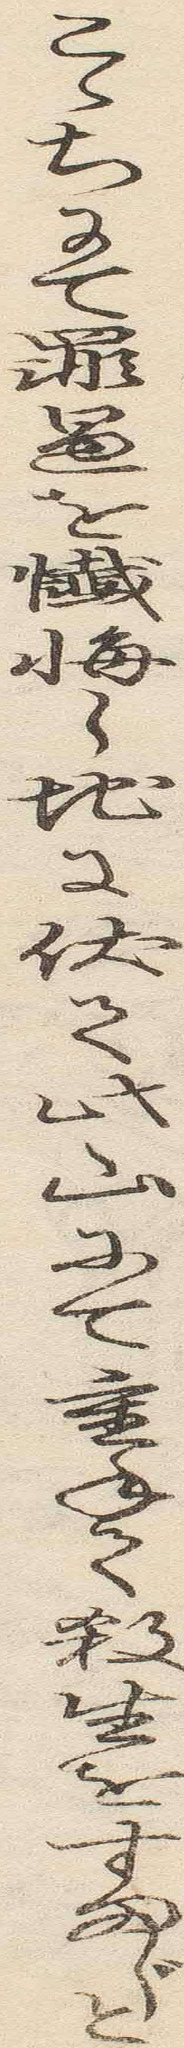こゝちにて罪過を懴悔し地に伏て此山にて重ねて殺生をすへじと
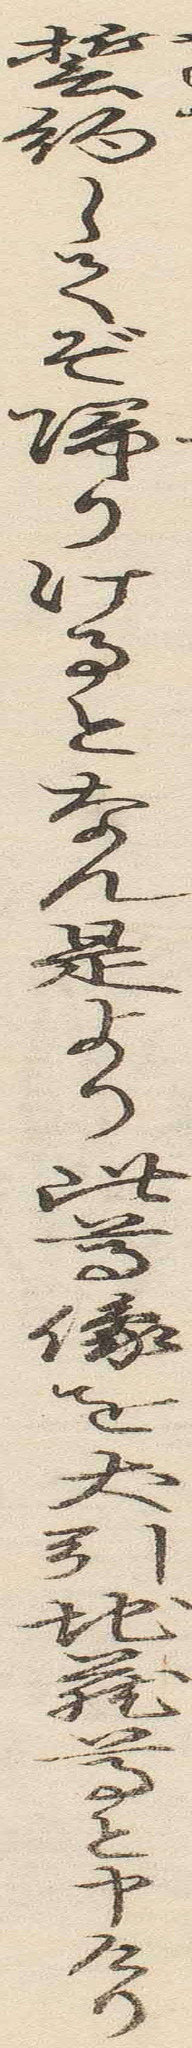誓約してぞ帰りけるとなん是より此尊像を犬牽地蔵尊と申けり
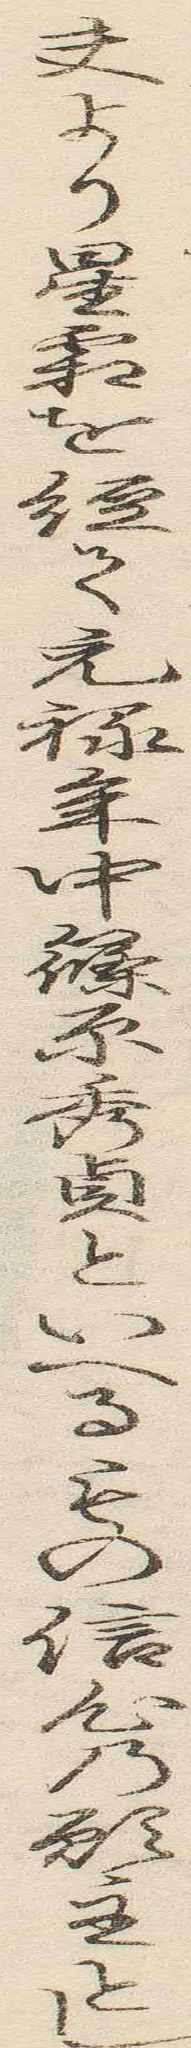夫より星霜を經て元禄年中篠原秀貞といへるもの信心の願主とし
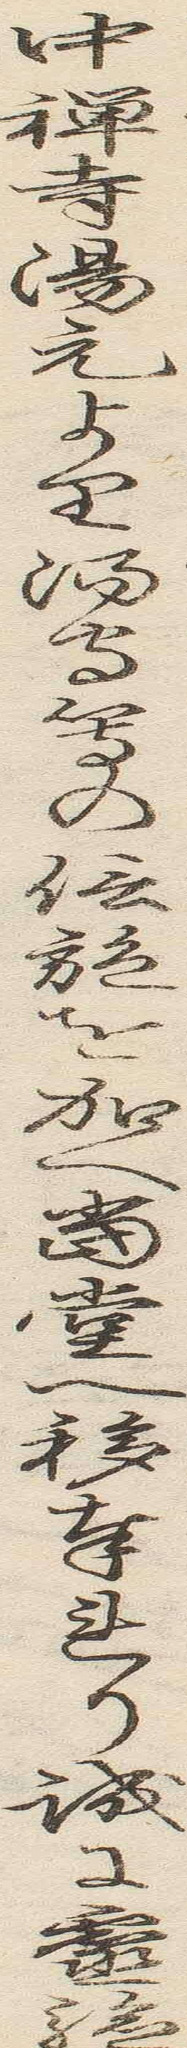中禅寺湯本より湯守等の信施を加へ當堂へ移奉れり誠に靈験
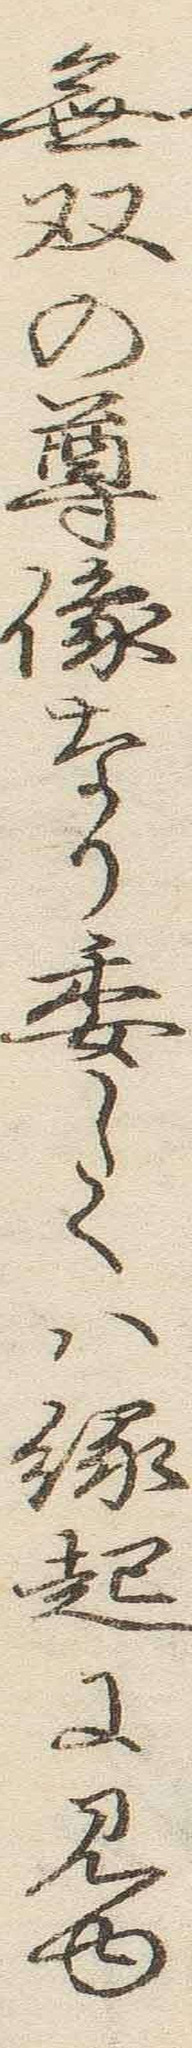無双の尊像なり委しくは縁起に見ゆ
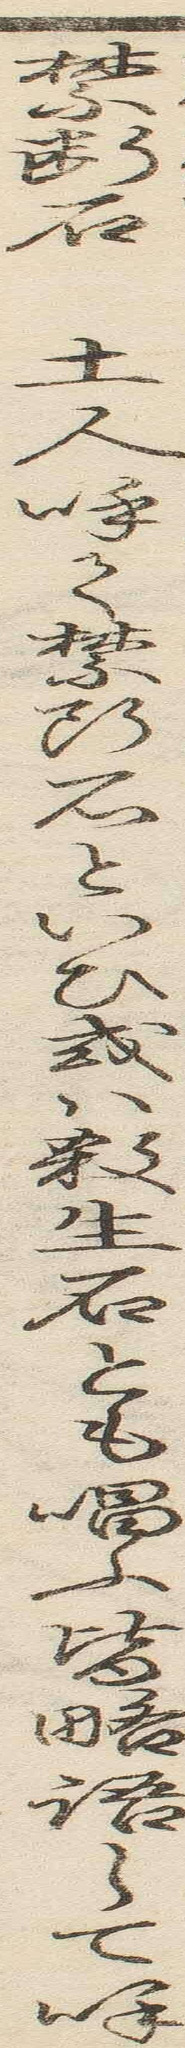禁断石土人呼て禁断石といひ或は殺生石とも唱ふ皆略語して呼
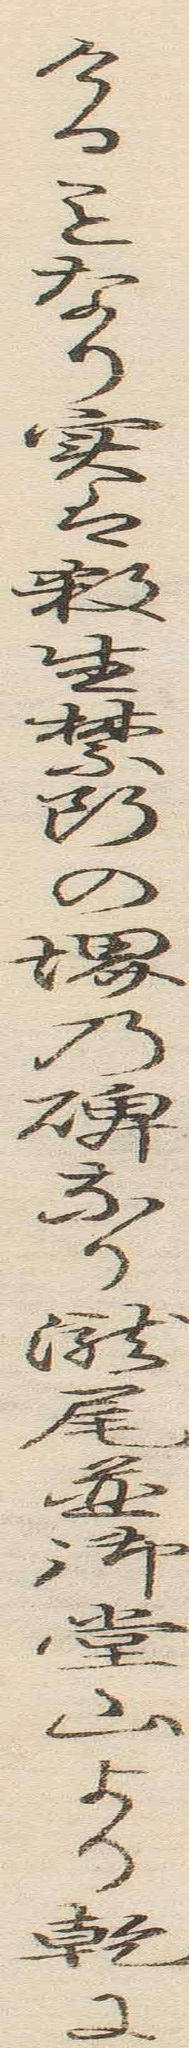けることなり実は殺生禁断の堺の碑なり瀧尾並御堂山より乾に
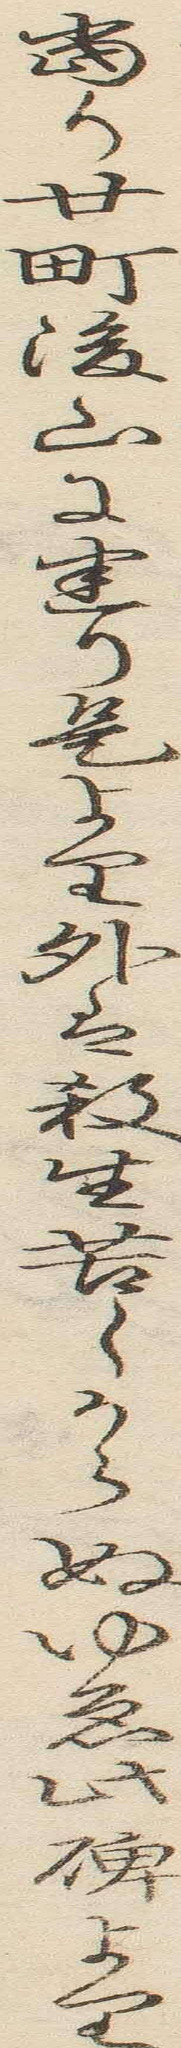當り廿町後山に建り是より外は殺生苦しからぬゆゑ此碑より
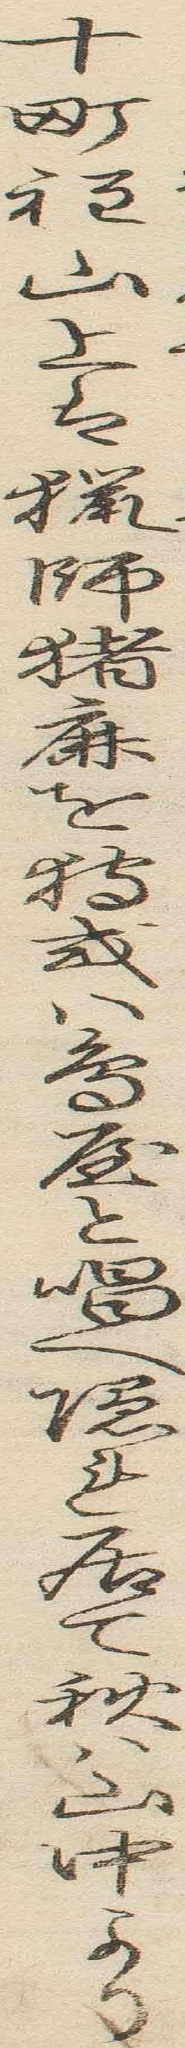十町程山上は猟師猪鹿を狩或は鳥屋と唱へ隠れ居て秋は山中より
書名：日光山志
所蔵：東京学芸大学附属図書館 国文学研究資料館
